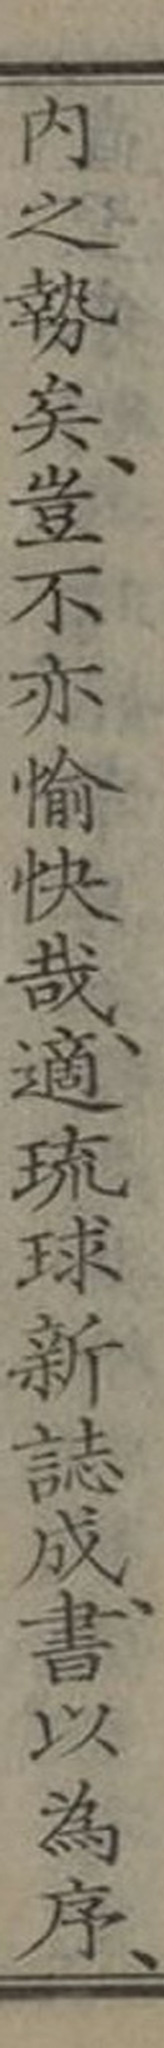内之勢矣、豈不亦愉快哉、適琉球新誌成、書以為序、
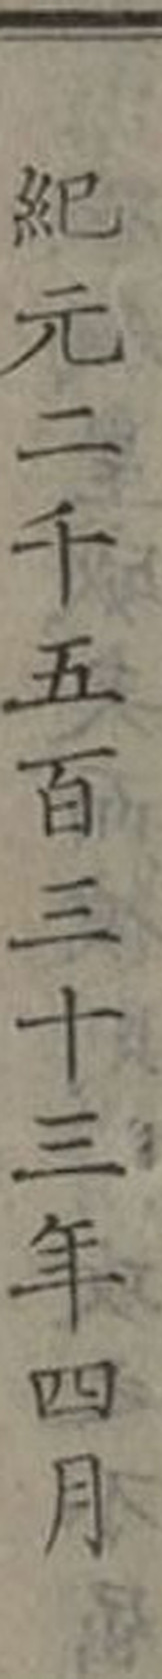紀元二千五百三十三年四月
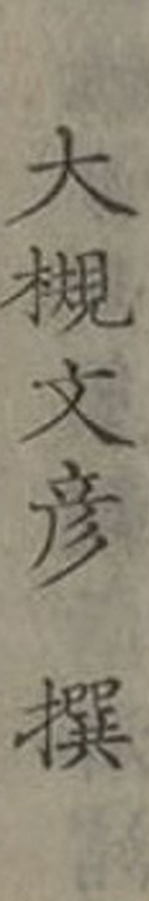大槻文彦撰
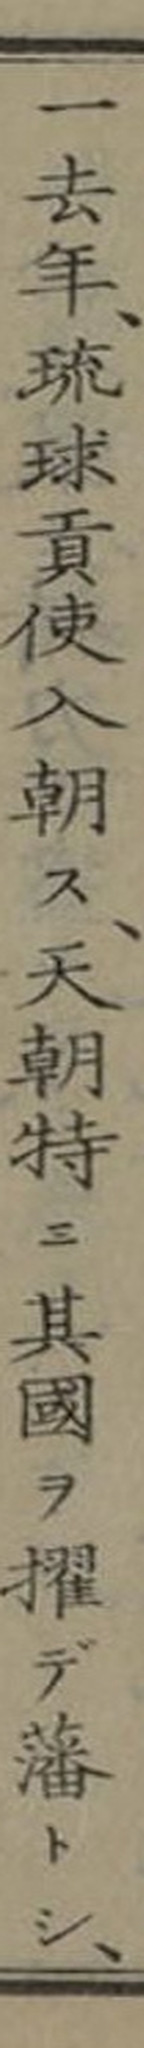一去年、琉球貢使入朝ス、天朝特ニ其国ヲ擢デ藩トシ、
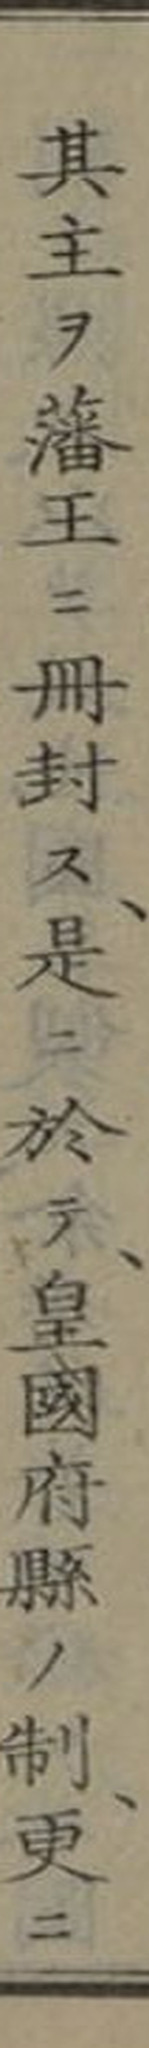其主ヲ藩王ニ冊封ス、是ニ於テ、皇国府県ノ制、更ニ
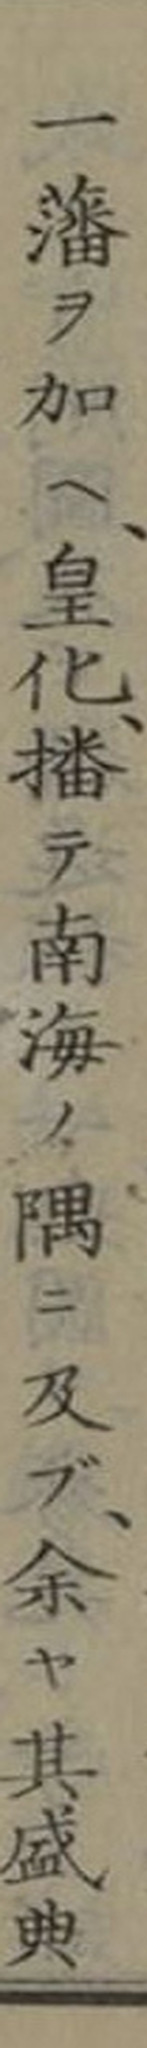一藩ヲ加ヘ、皇化、播テ南海ノ隅ニ及ブ、余ヤ其盛典
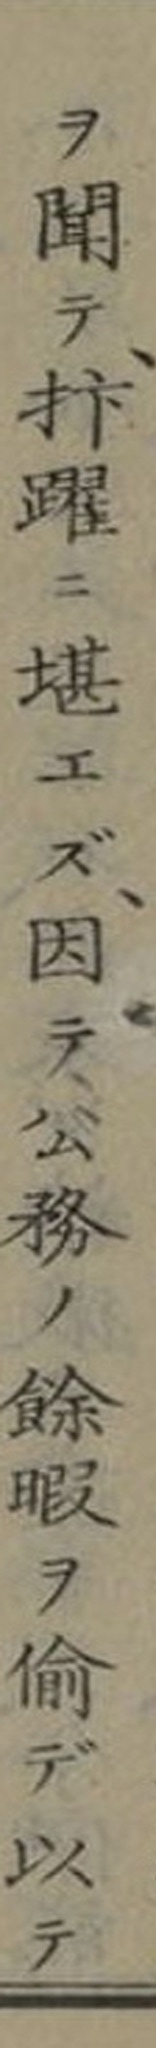ヲ聞テ、抃躍ニ堪エズ、因テ公務ノ余暇ヲ愉デ以テ
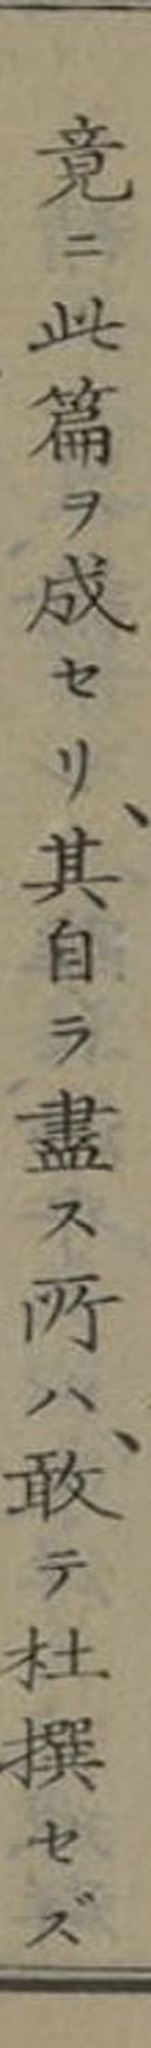竟ニ此篇ヲ成セリ、其自ラ尽ス所ハ、敢テ杜撰セズ
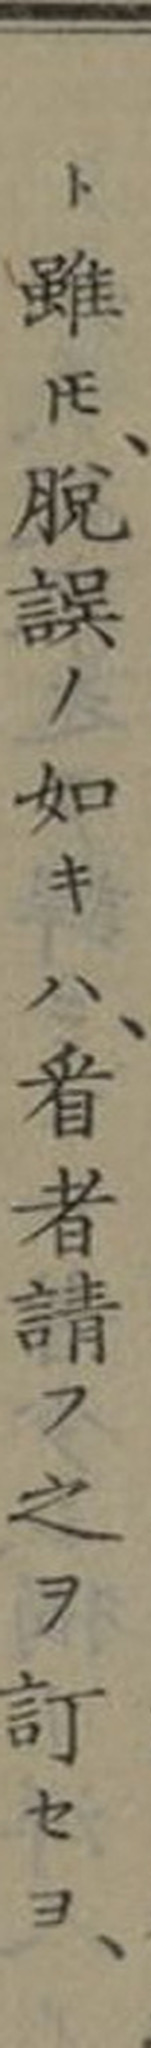ト雖トモ、脱誤ノ如キハ、看者請フ之ヲ訂セヨ、
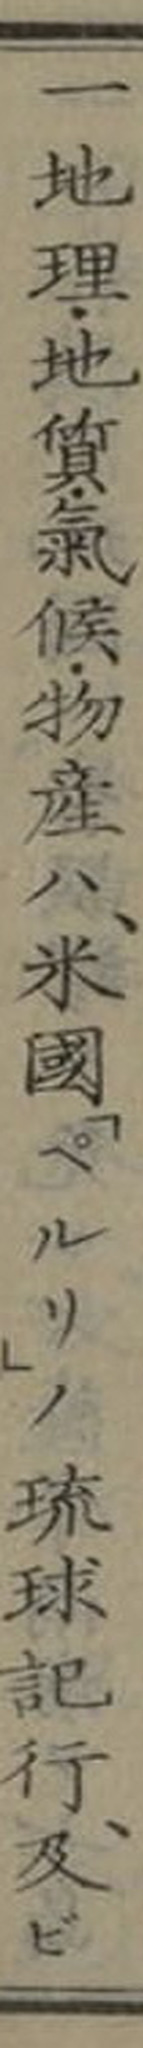一地理・地質・気候・物産ハ、米国「ペルリ」ノ琉球記行、及ビ
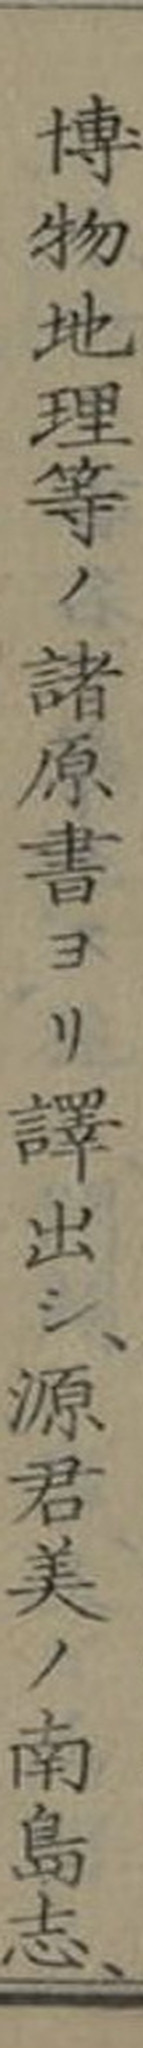博物地理等ノ諸原書ヨリ訳出シ、源君美ノ南島志、
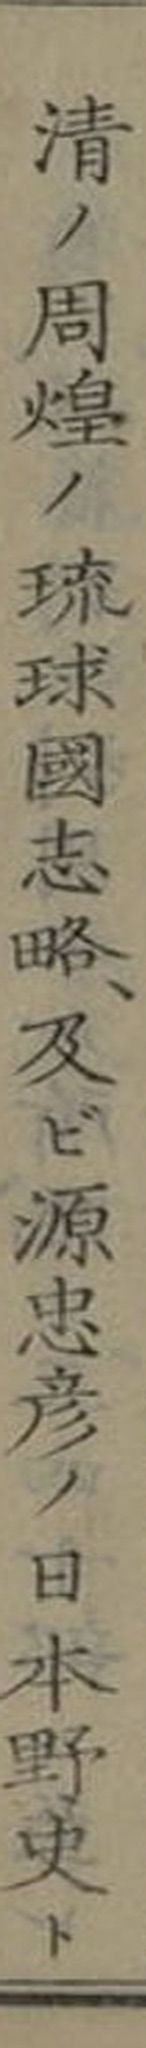清ノ周煌ノ琉球国志略、及ビ源忠彦ノ日本野史ト
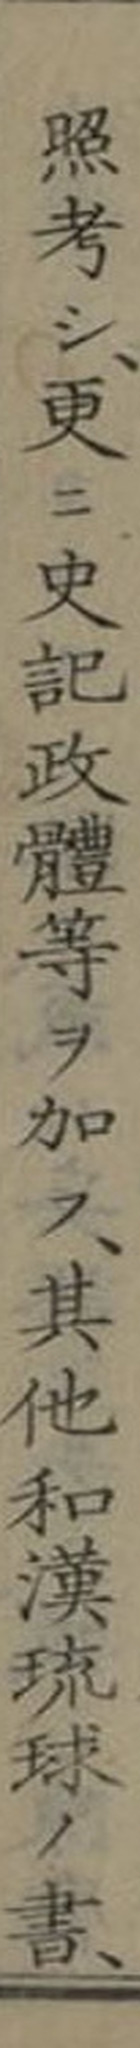照考シ、更ニ史記政体等ヲ加フ、其他和漢琉球ノ書、

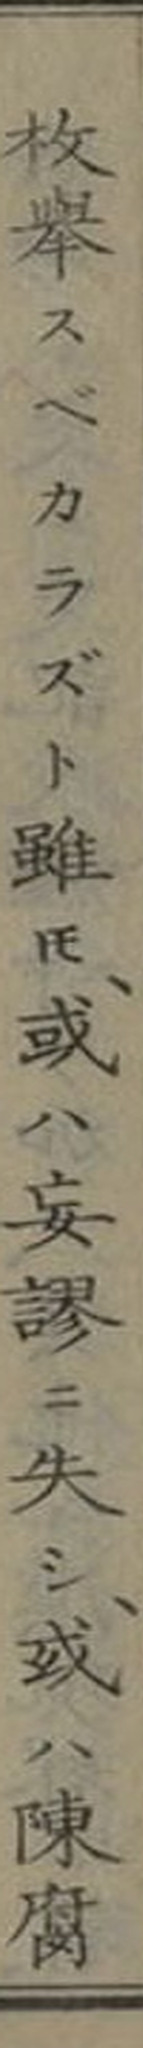枚挙スベカラズト雖トモ、或ハ妄謬二失シ、或ハ陳腐
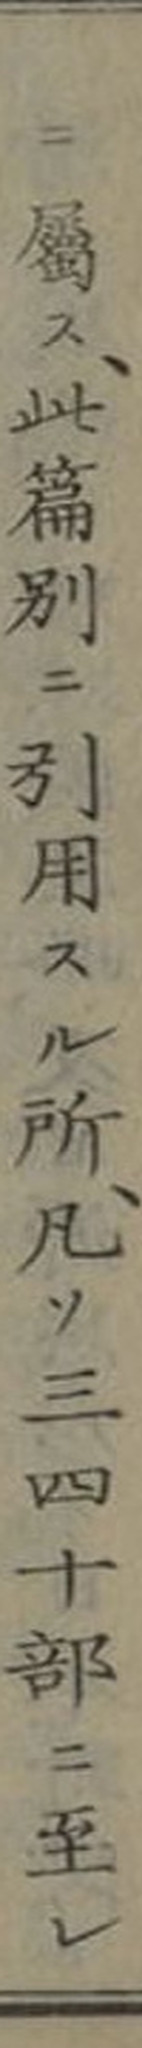ニ属ス、此篇別ニ引用スル所、凡ソ三四十部ニ至レ
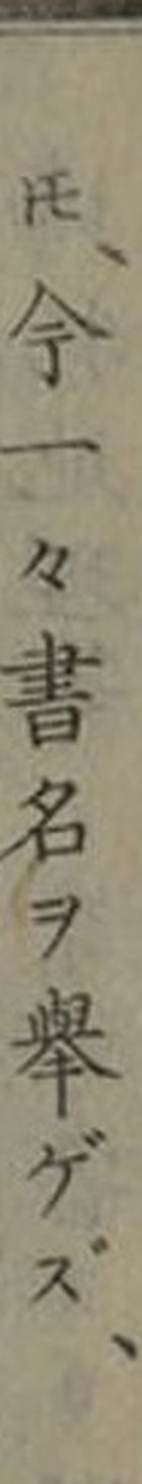トモ、今一々書名ヲ挙ゲズ、
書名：琉球新誌 図附 上
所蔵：University of the Ryukyus Library
